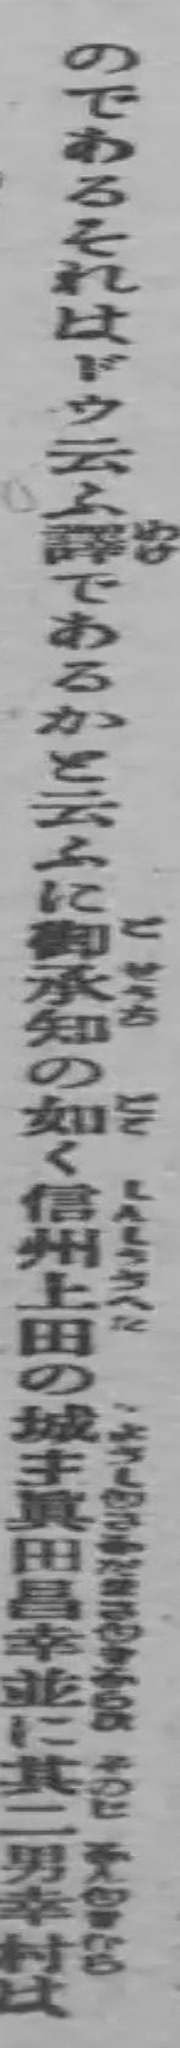上田城のであるそれはドウ云ふ訳であるかと云ふに御承知の如く信州上田の城主真田昌幸並に其二男幸村は
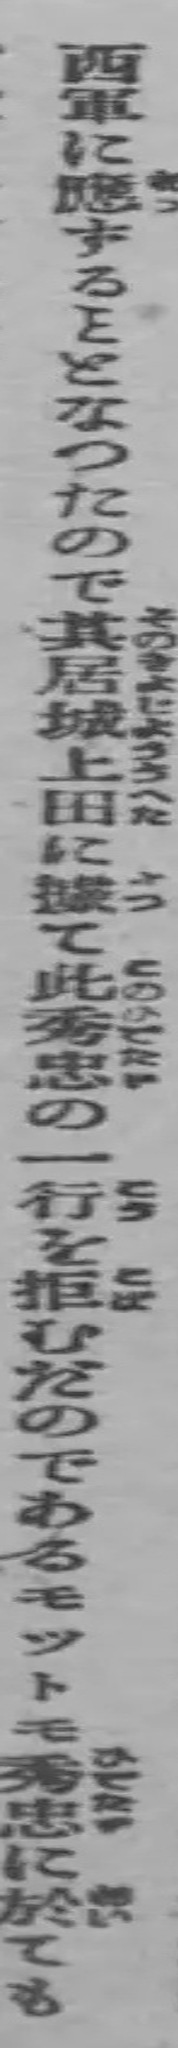西軍に応ずることとなつたので其居城上田に拠て此秀忠の一行を拒むだのであるモツトモ秀忠に於ても
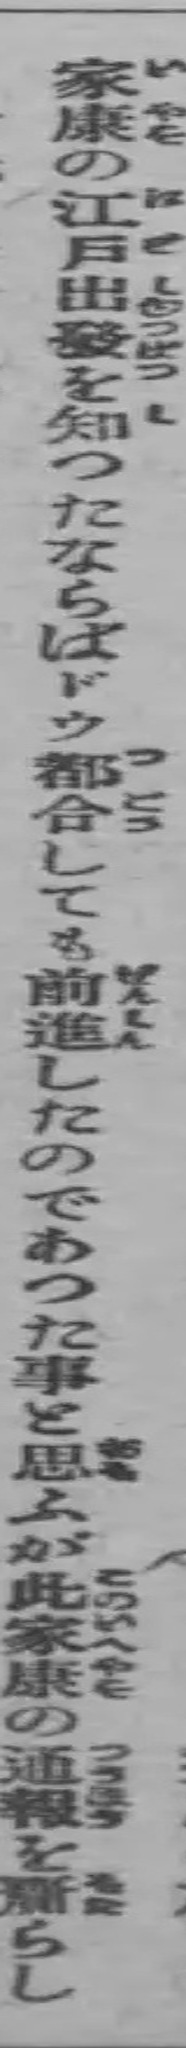家康の江戸出発を知つたならばドウ都合しても前進したのであつた事と思ふが此家康の通報を齎らし
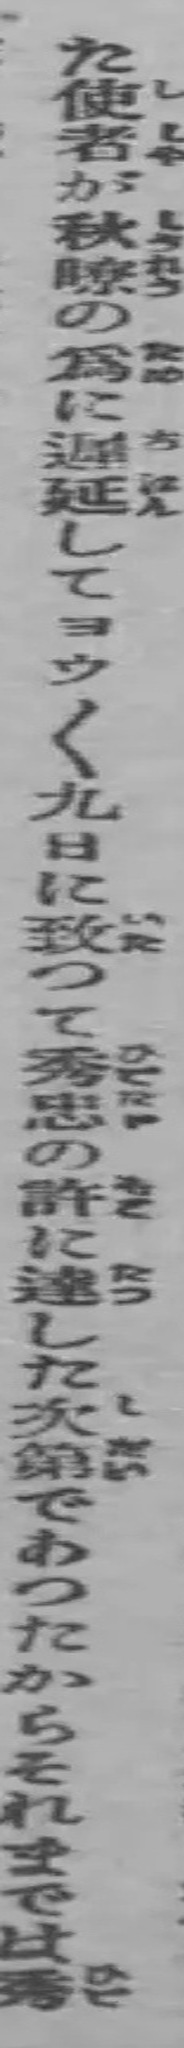た使者が秋瞭の為に遅延してヨウ〳〵九日に致つて秀忠の許に達した次第であつたからそれまでは秀
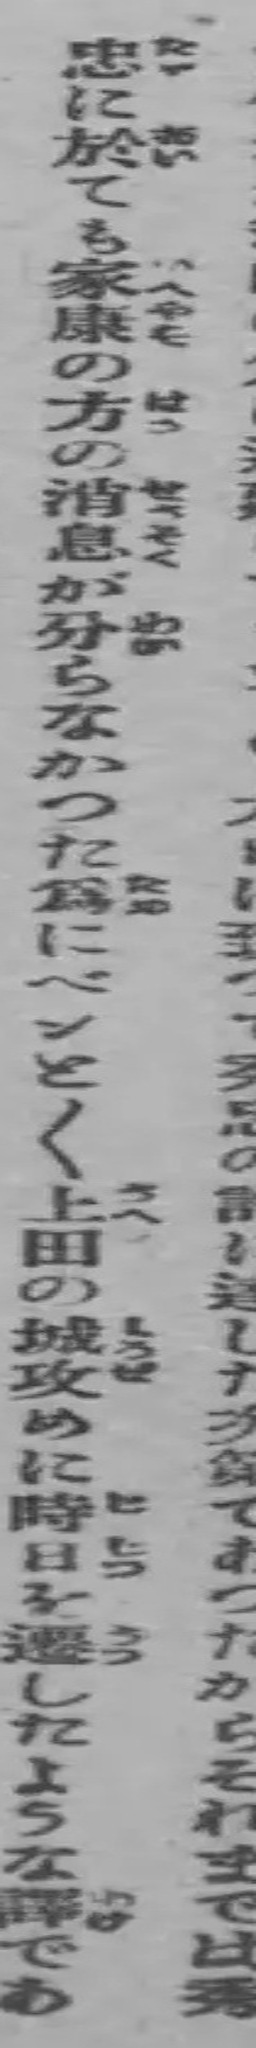忠に於ても家康の方の消息が分らなかつた為にベンと〳〵上田の城攻めに時日を遷したような訳であ
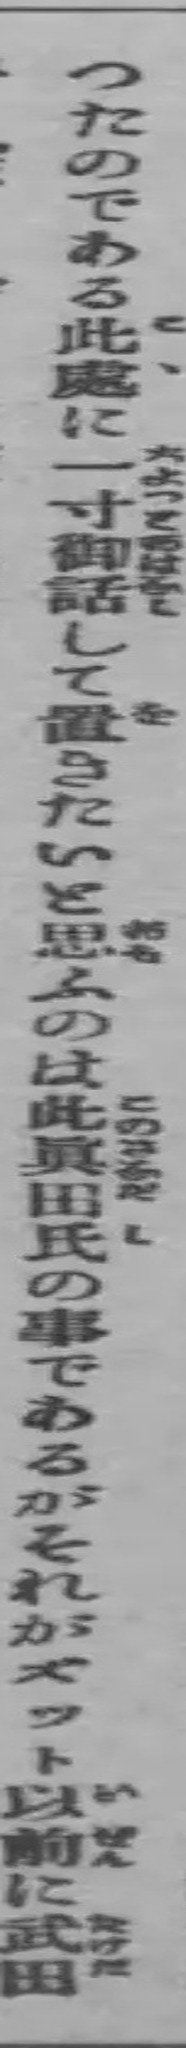つたのである此処に一寸御話して置きたいと思ふのは此真田氏の事であるがそれがズツト以前に武田
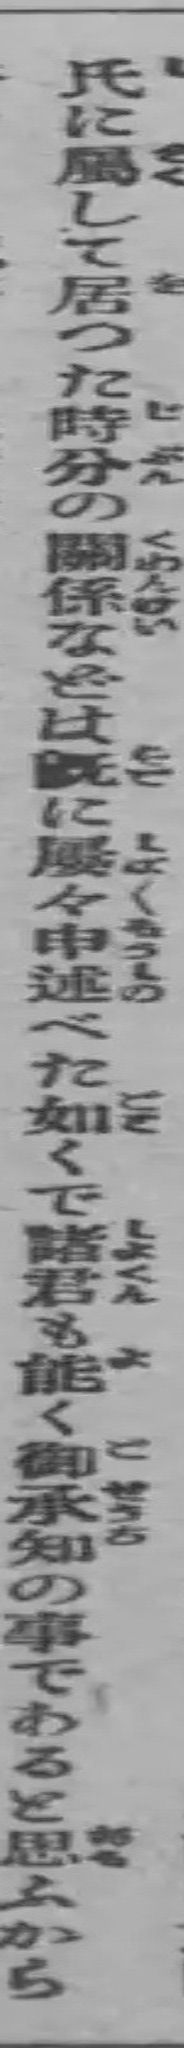真田信幸氏に属して居つた時分の関係などは既に屡々申述べた如くで諸君も能く御承知の事であると思ふから
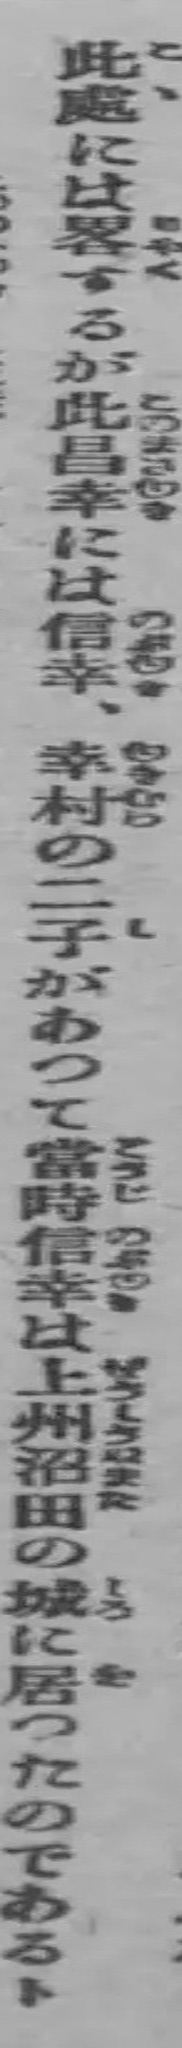此処には略するが此昌幸には信幸、幸村の二子があつて当時信幸は上州沼田の城に居つたのであるト
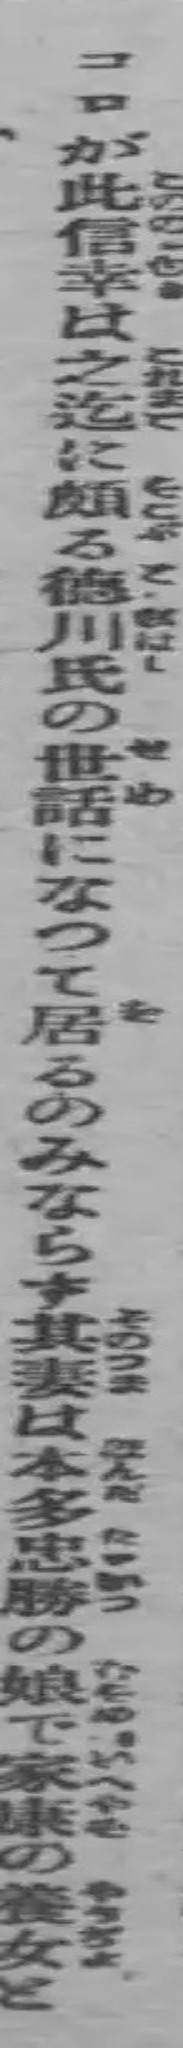コロが此信幸は之迄に頗る徳川氏の世話になつて居るのみならず其妻は本多忠勝の娘で家康の養女と
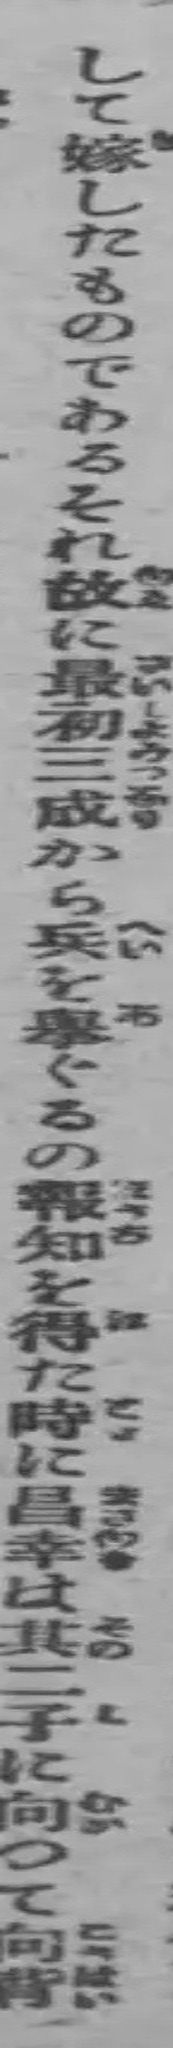して嫁したものであるそれ故に最初三成から兵を挙ぐるの報知を得た時に昌幸は其二子に向つて向背
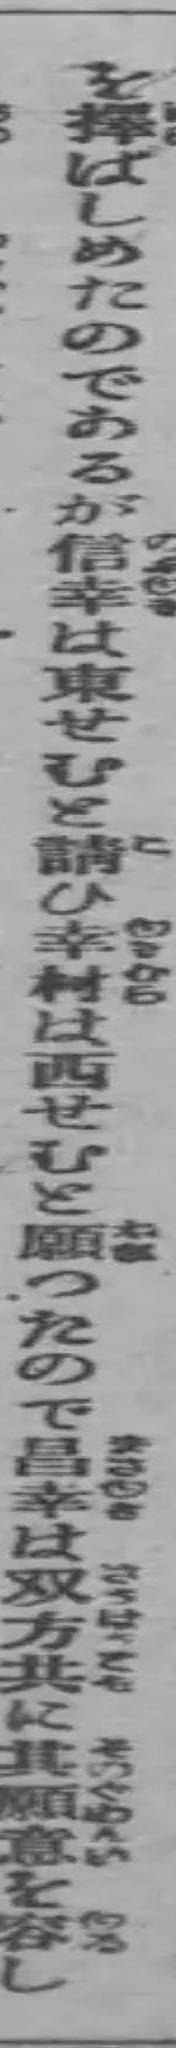を擇ばしめたのであるが信幸は東せむと請ひ幸村は西せむと願つたので昌幸は双方共に其願意を容し
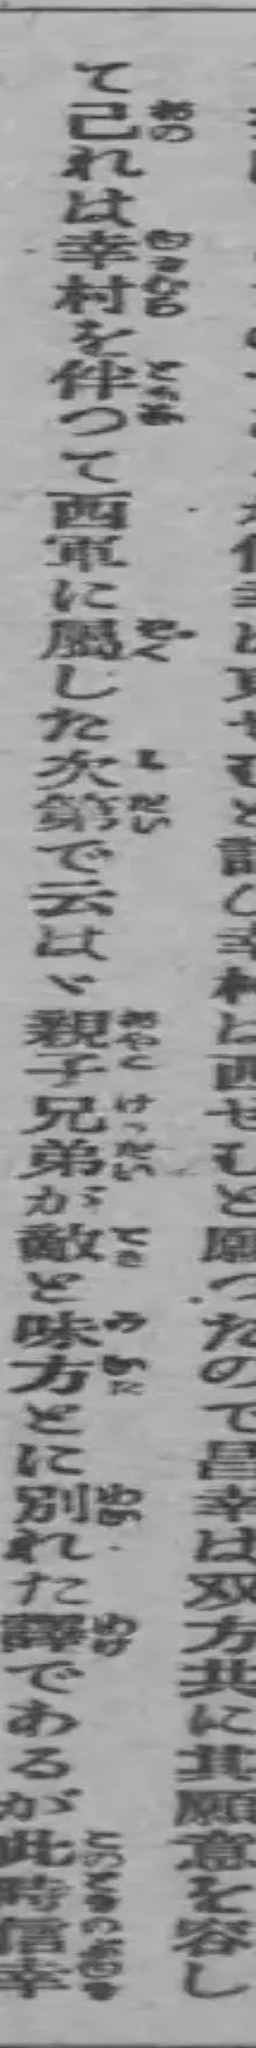て己れは幸村を伴つて西軍に属した次第で云はゞ親子兄弟が敵と味方とに別れた訳であるが此時信幸
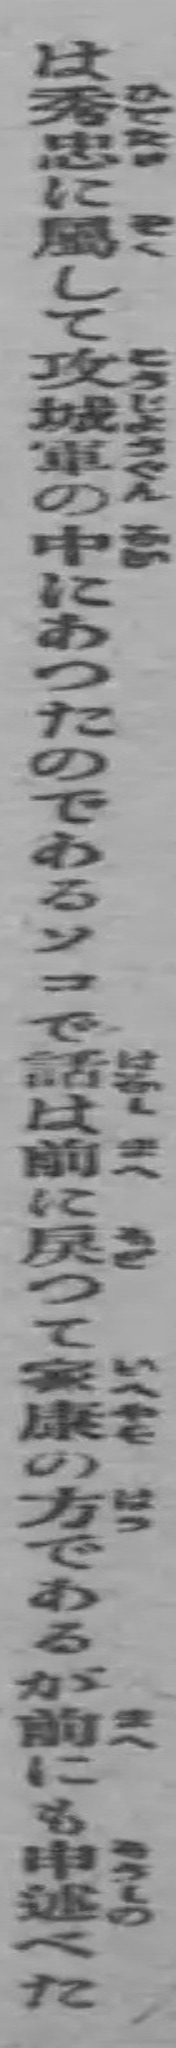は秀忠に属して攻城軍の中にあつたのであるソコで話は前に戻つて家康の方であるが前にも申述べた
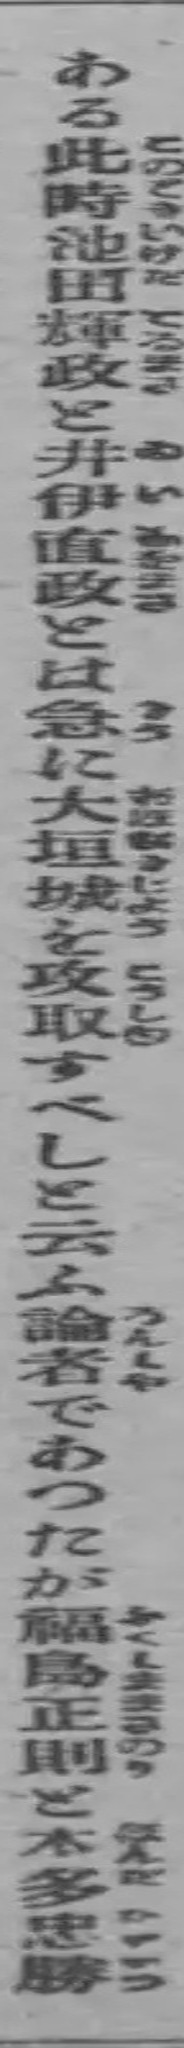ある此時池田輝政と井伊直正とは急に大垣城を攻取すべしと云ふ論者であつたが福島正則と本多忠勝
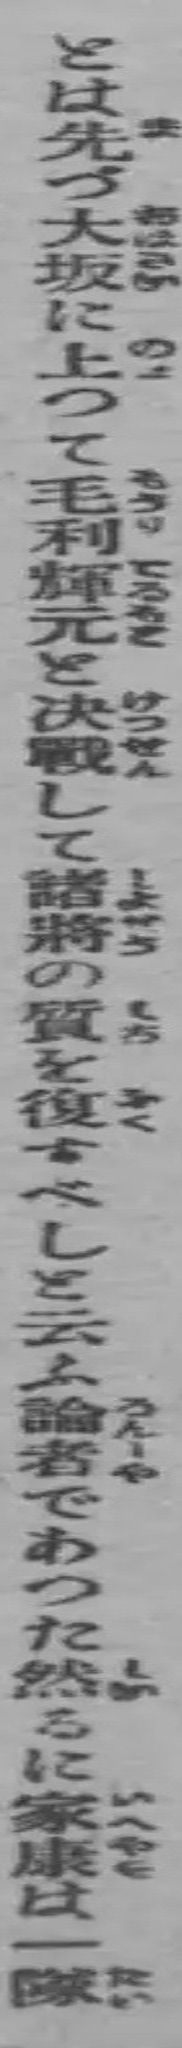とは先づ大坂に上つて毛利輝元と決戦して諸将の質を復すべしと云ふ論者であつた然るに家康は一隊
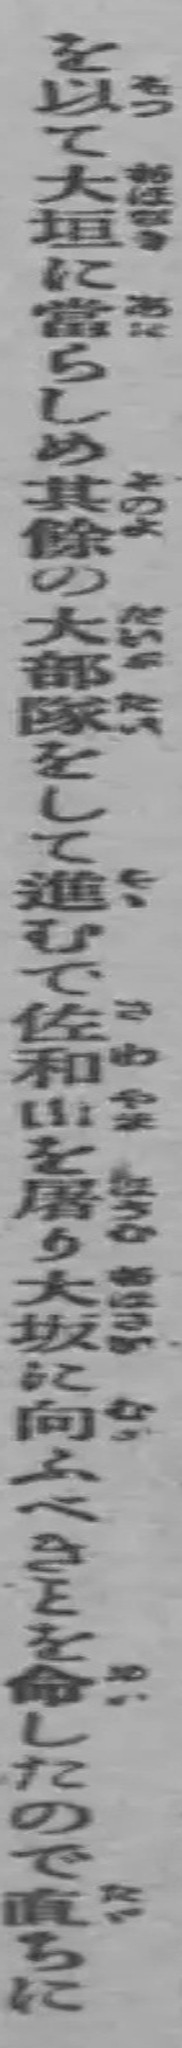を以て大垣に当らしめ其余の大部隊をして進むで佐和山を屠り大坂に向ふべきことを命したので直ちに
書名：豊橋市史談
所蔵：国立国会図書館 National Diet Library, JAPAN
